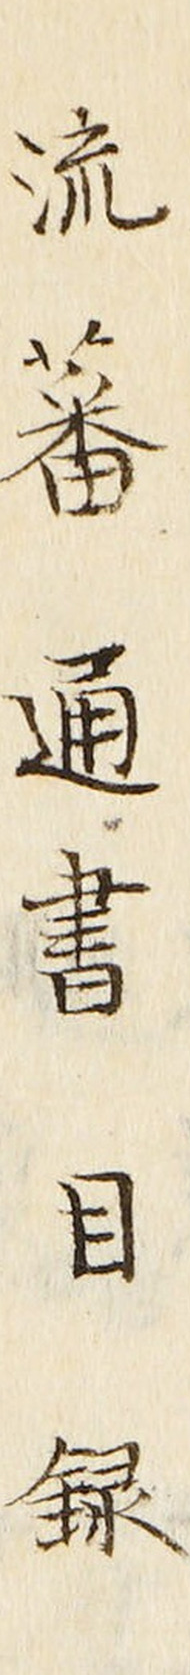流蕃通書目録
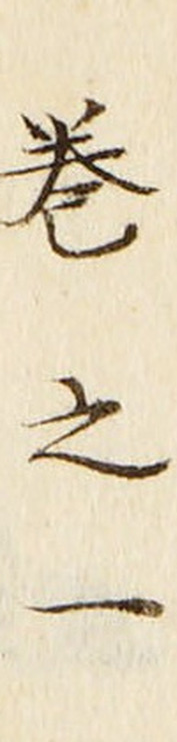巻之一
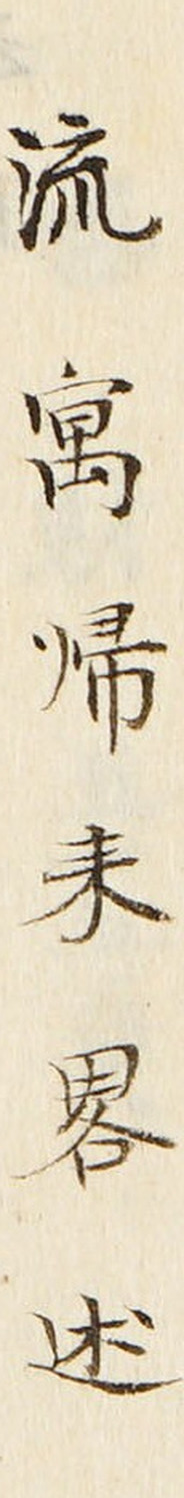流寓帰来略述
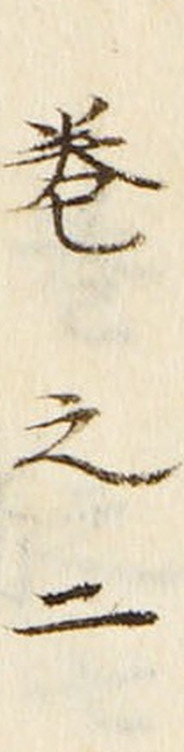巻之二
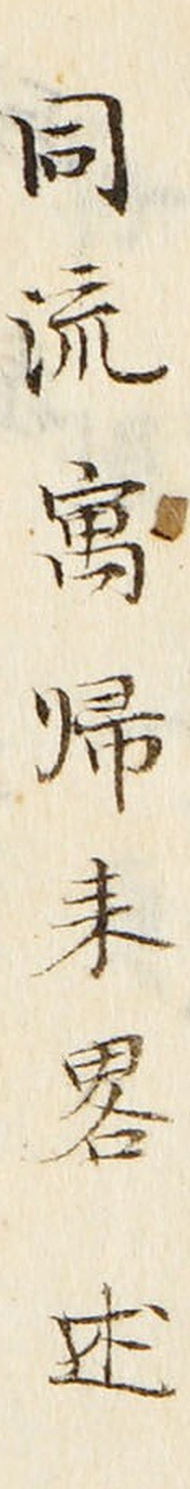同流寓帰来略述
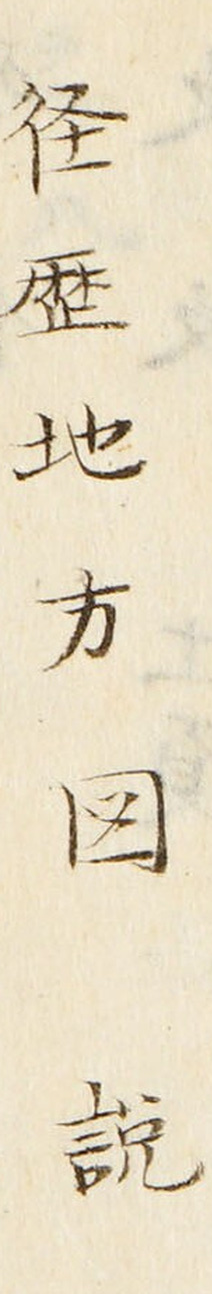径歴地方図説
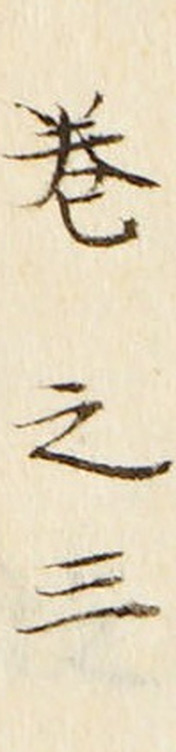巻之三
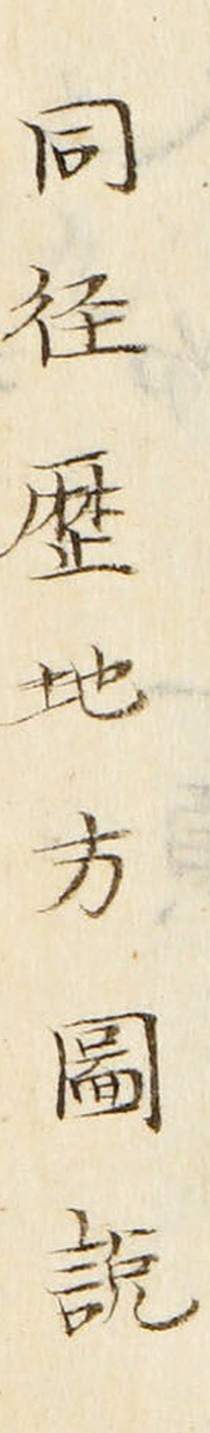同径歴地方図説
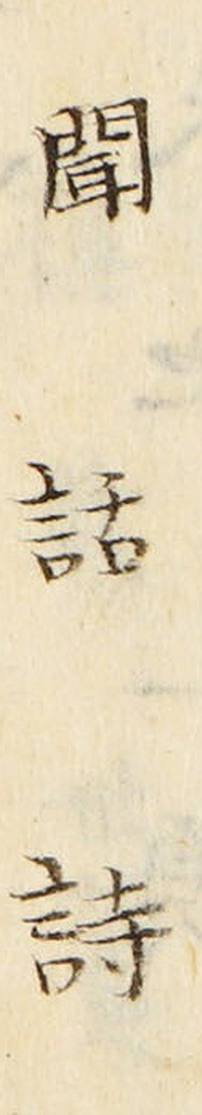聞話詩

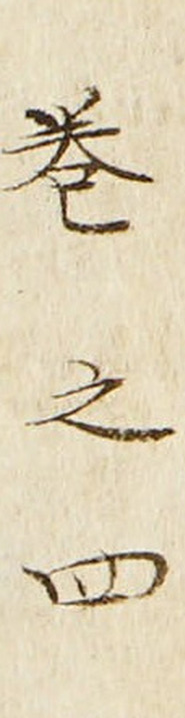巻之四
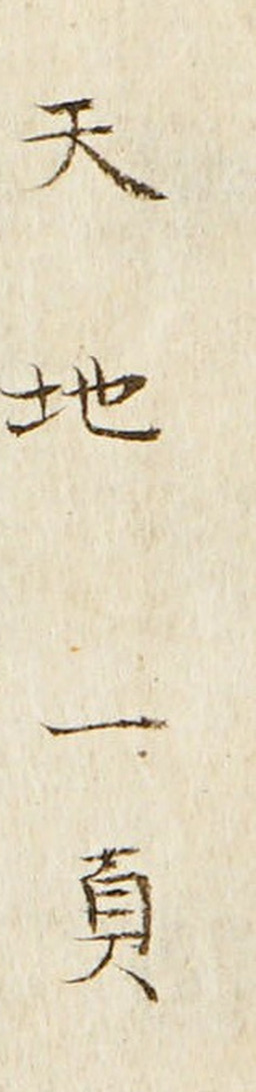天地一頁
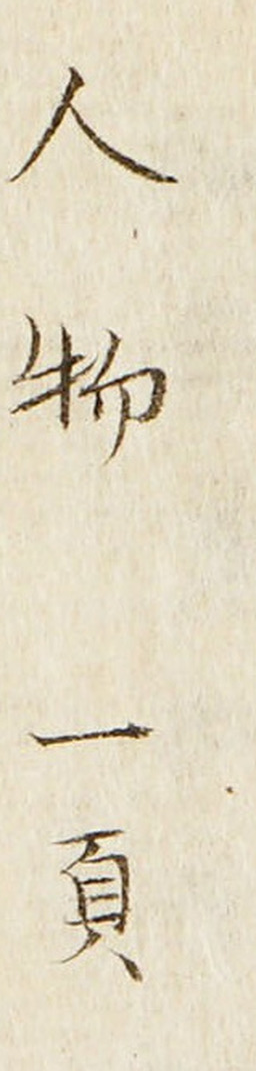人物一頁
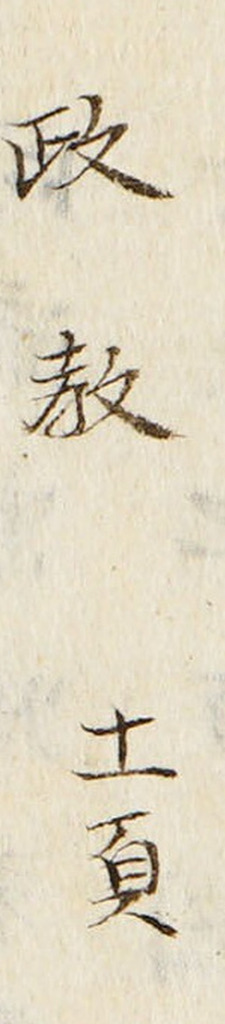政教十一頁
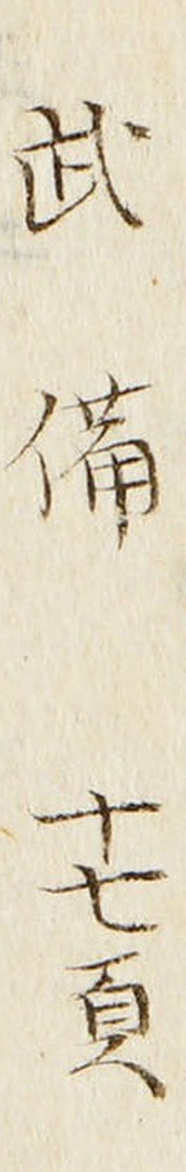武備十七頁
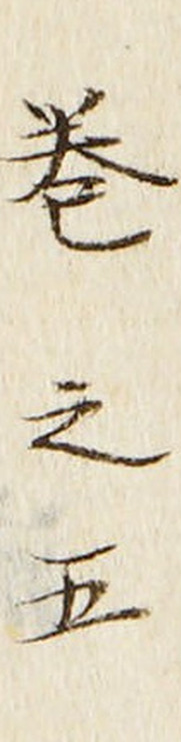巻之五
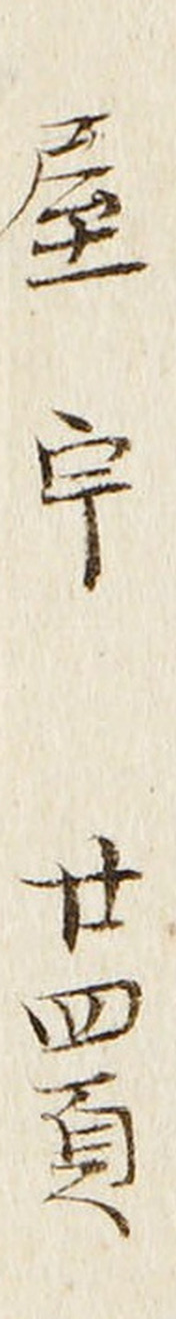屋𡧃廿四頁
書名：流蕃通書
